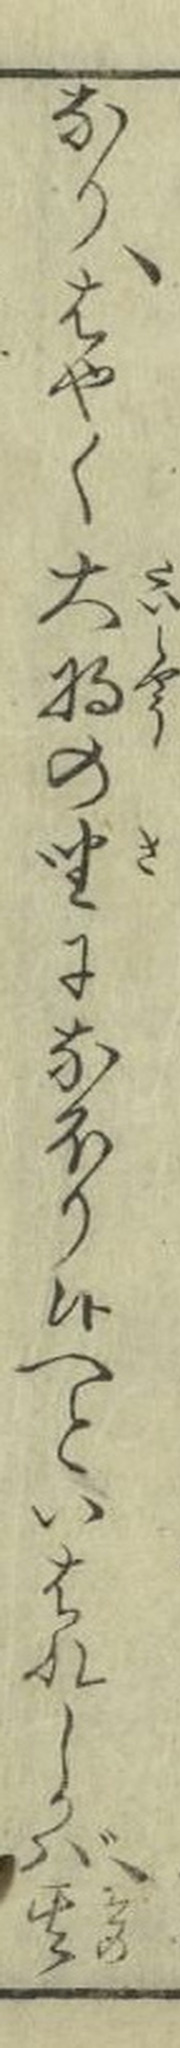なり、はやく大将の坐になほり候へといはれしかば、其
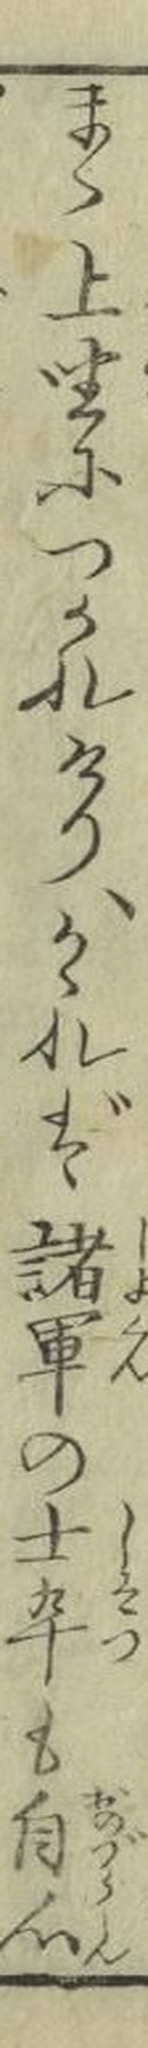まゝ上坐につかれけり、かゝれば諸軍の士卒も自心
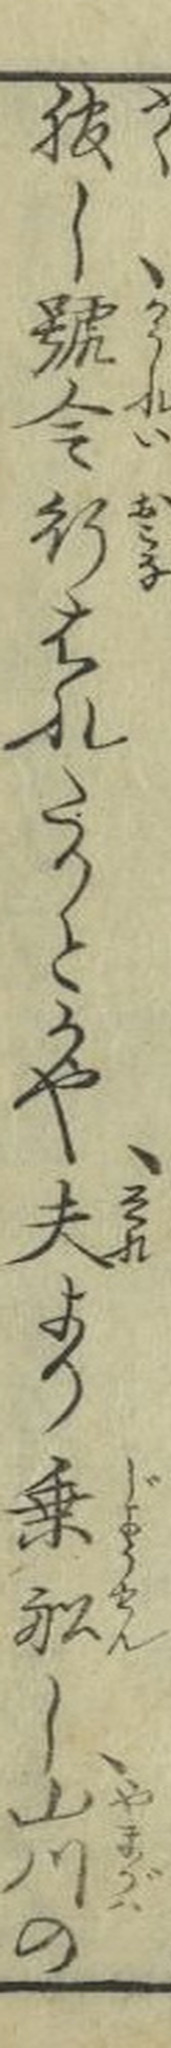服し、号令行はれたりとかや、夫より乗船し、山川の

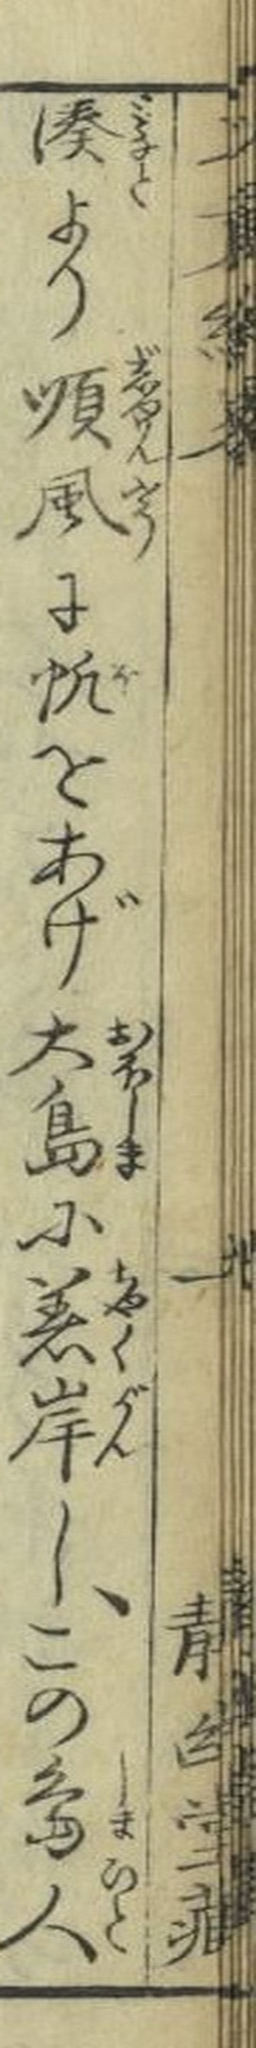湊より順風に帆をあげ大島に着岸し、この島人
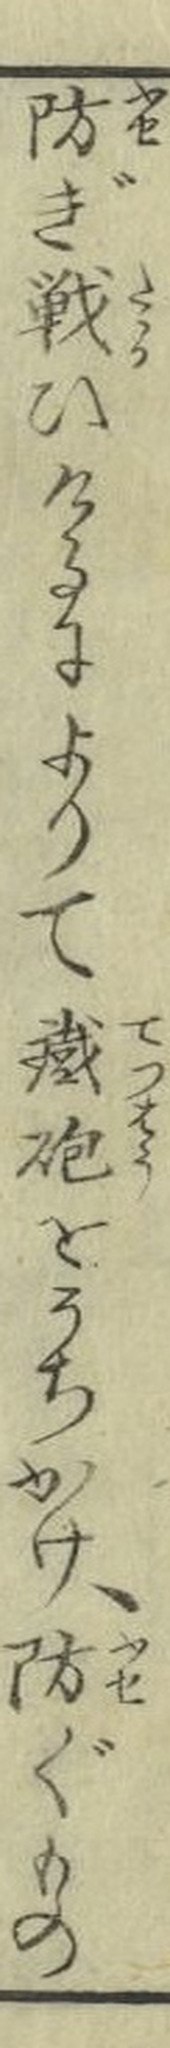防ぎ戦ひけるによりて鉄砲をうちかけ、防ぐもの
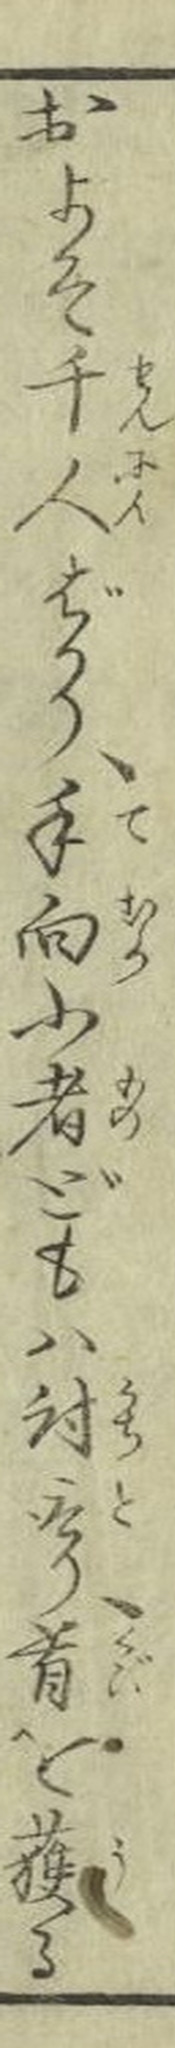およそ千人ばかり、手向ふ者どもは討取り、首を獲る
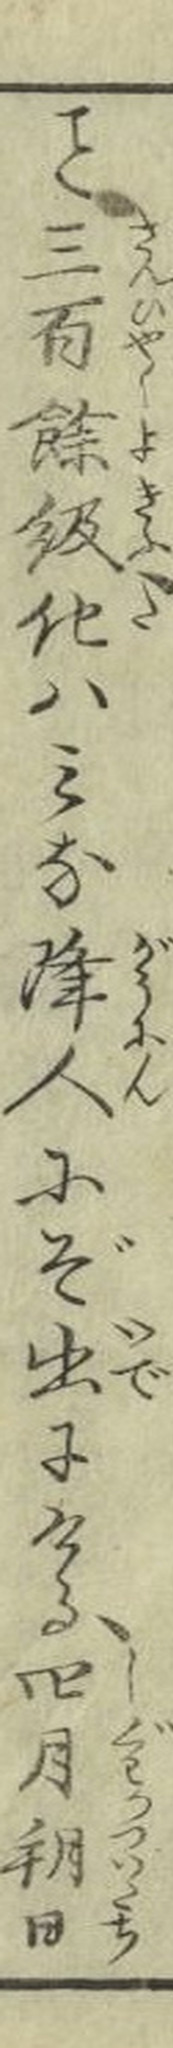こと三百余級、他はみな降人にぞ出にける、四月朔日
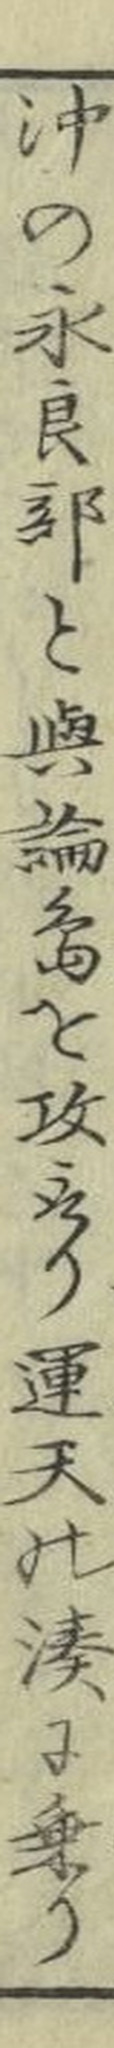沖の永良部と与論島を攻取り、運天の湊に乗り
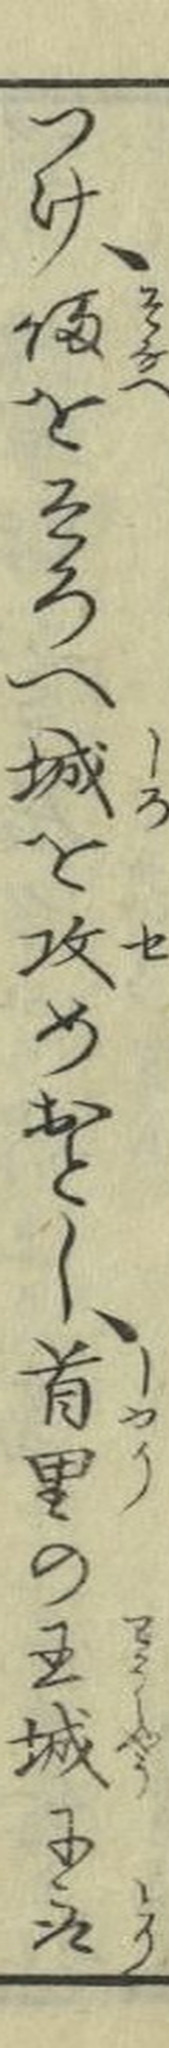つけ、備をそろへ城を攻めおとし、首里の王城に取
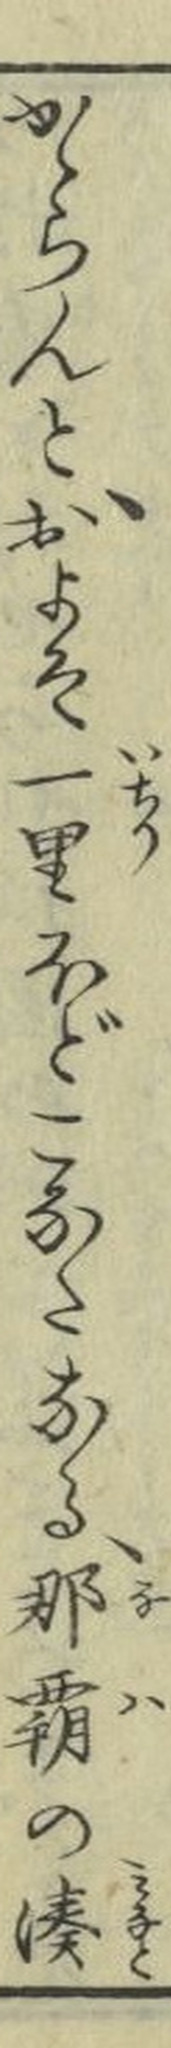かゝらんと、およそい一里ほどこなたなる、那覇の湊
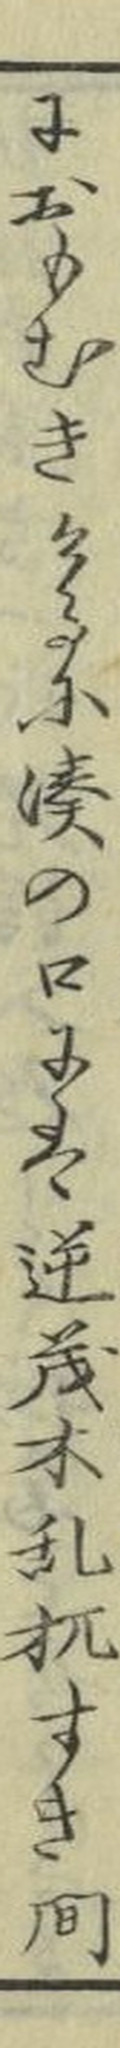におもむきけるに、湊の口には逆茂木乱杭すき間
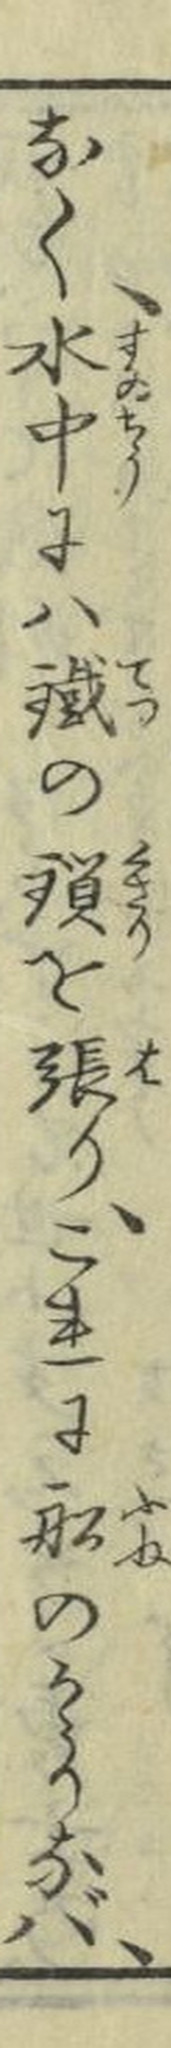なく、水中には鉄の鎖を張り、これに船のかゝりなば、
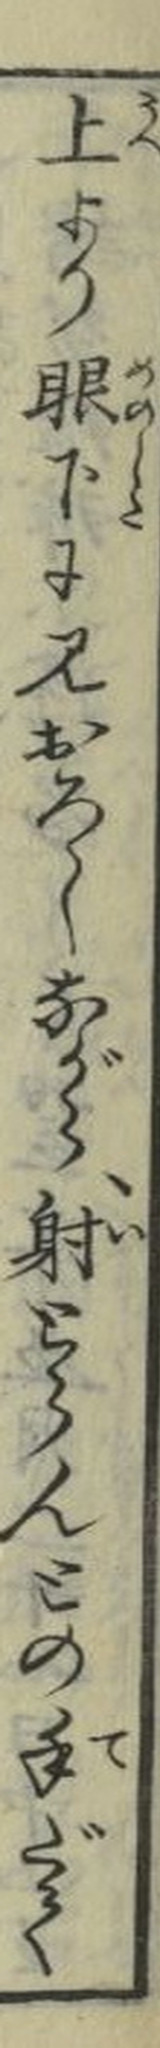上より眼下に見おろしながら、射とらんとの手だて
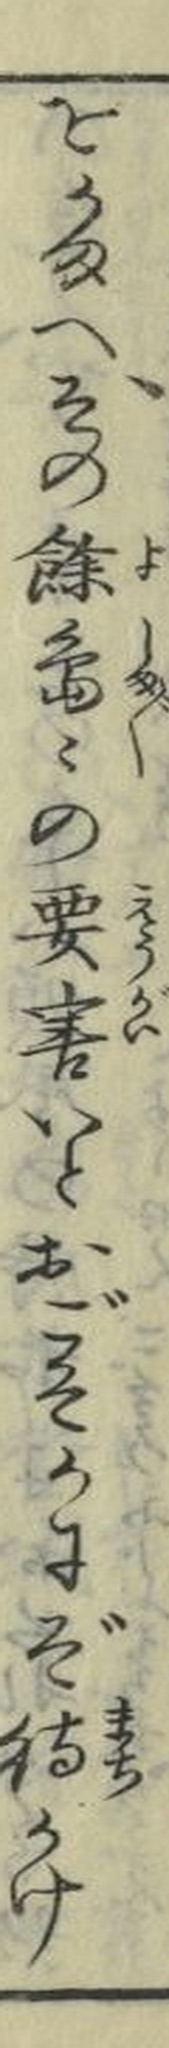をかまへ、その余島々の要害いとおごそかにぞ待かけ
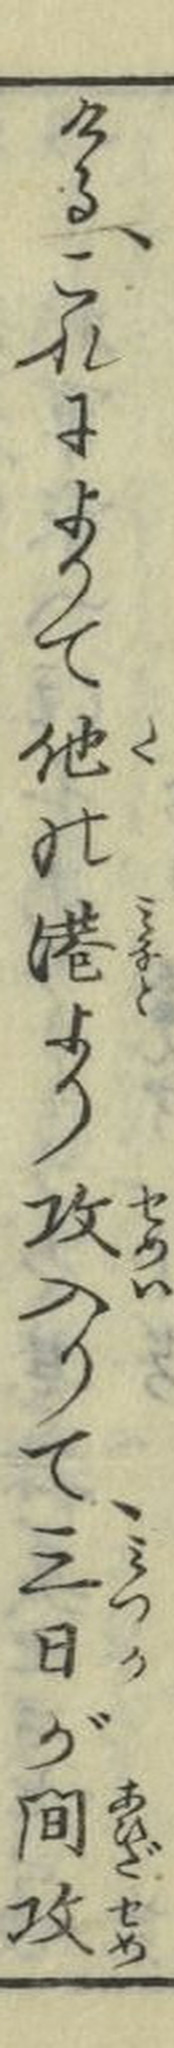ける、これによりて他の港より攻入りて、三日が間攻
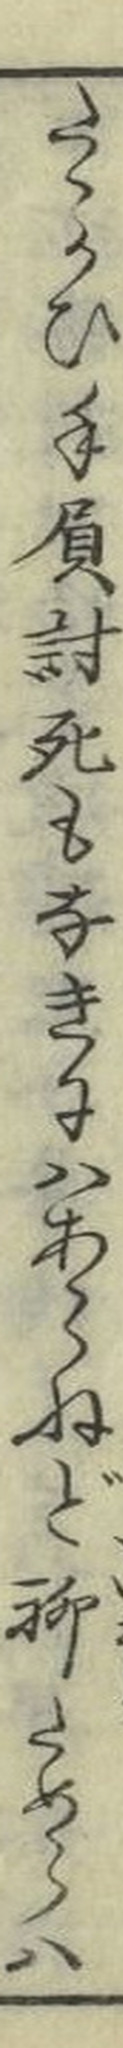たゝかひ、手負討死もなきにはあらねど、聊ためらは
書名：琉球入貢紀略
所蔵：University of the Ryukyus Library
